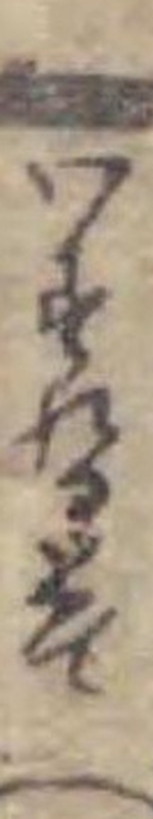わすれるとて
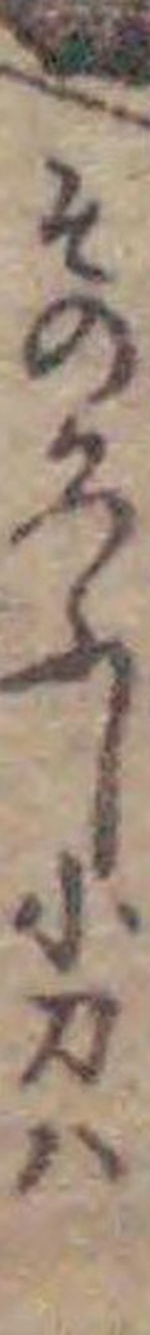そのかつふし小刀は
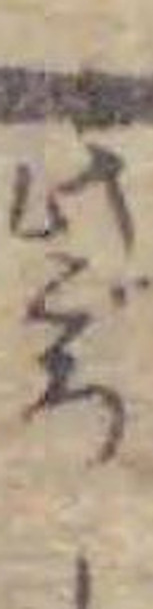此ごろ
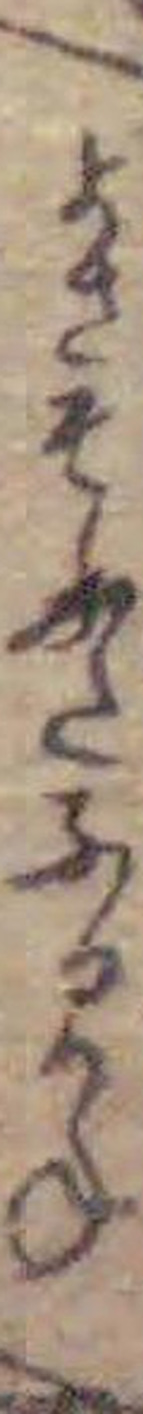よさそふたふるかね
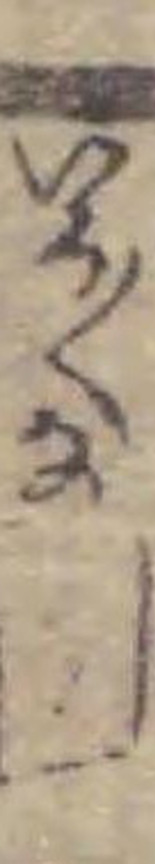いろ〳〵な
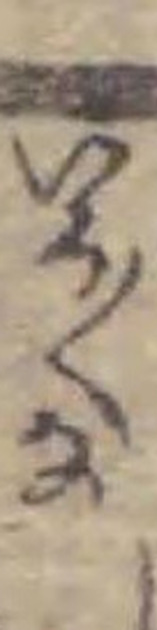いろ〳〵な
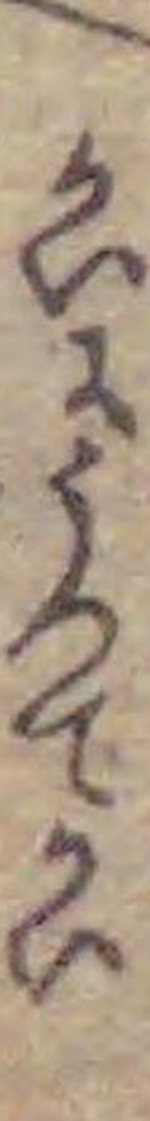かいにうつてかい
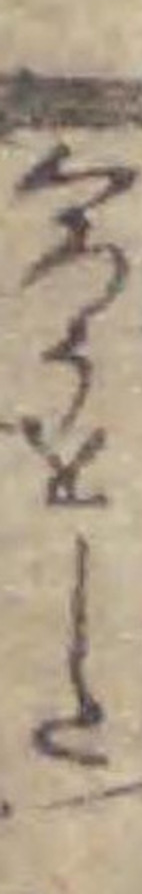くろうをした
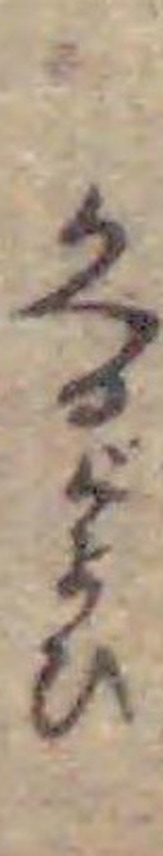かへるがよひ
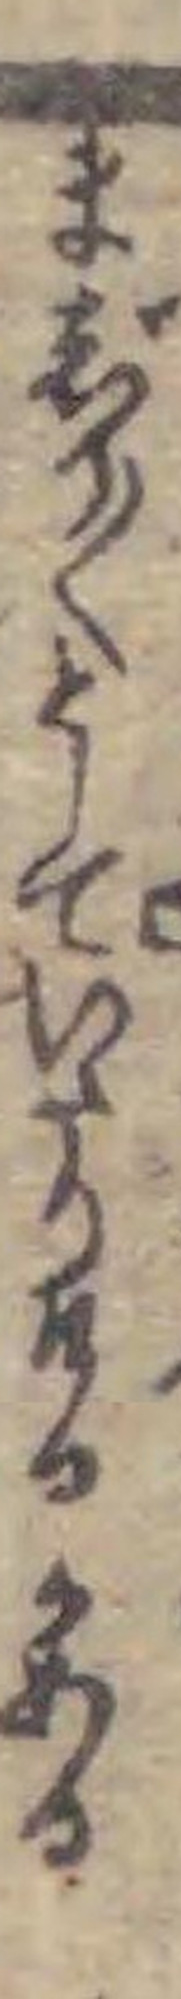まじり〳〵としていたりけるかある
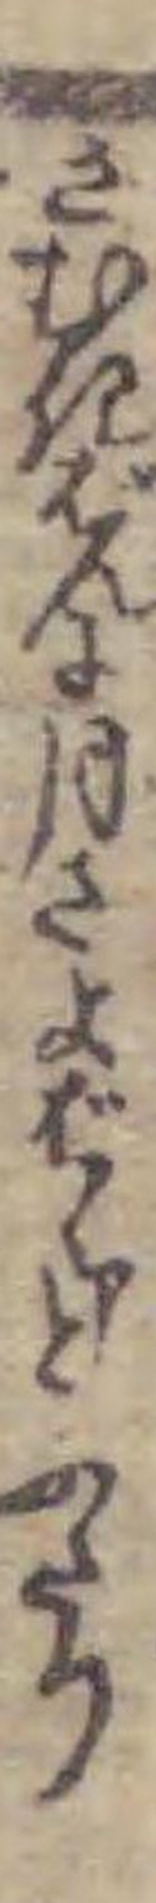さむきばんに月さよばゝ
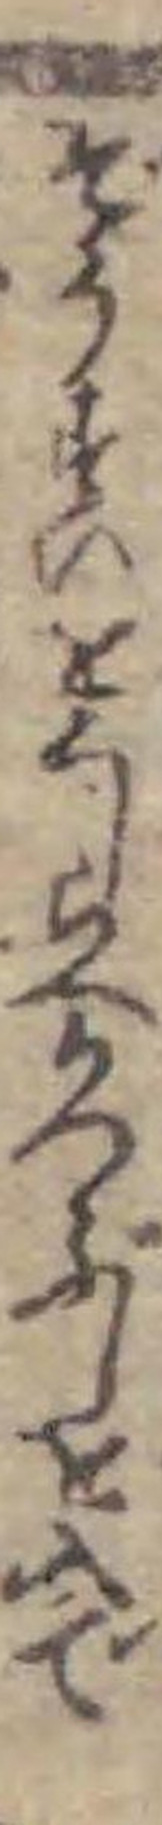ぞうすいをくしらへかつぶしを入て
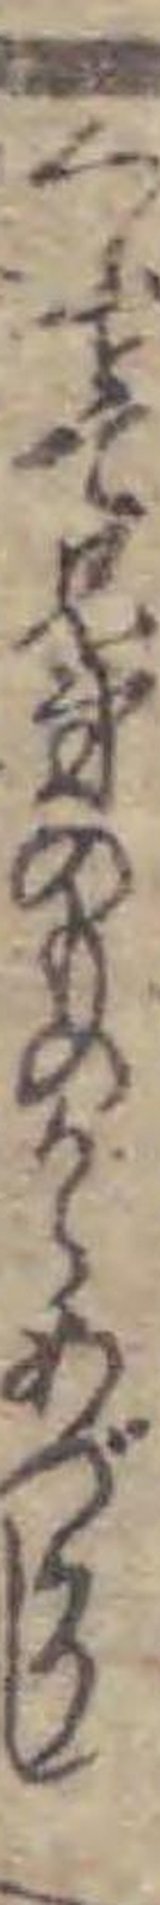くふとて兄弟のものからあづかりし
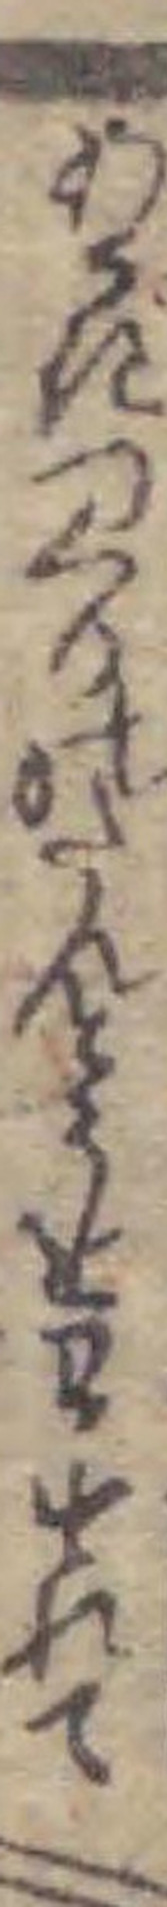あかぎつくりのたんとうをわすれて
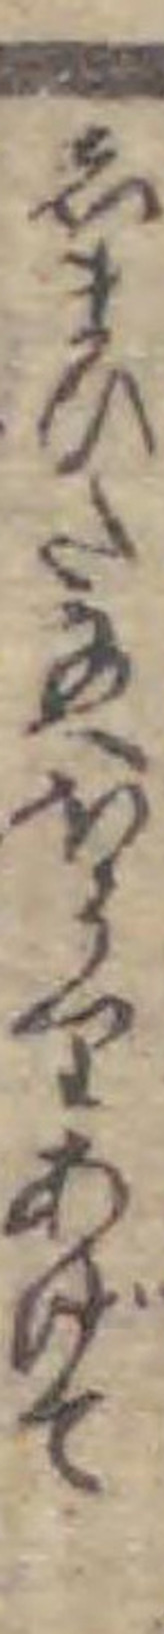しまひたなへほうりあげて
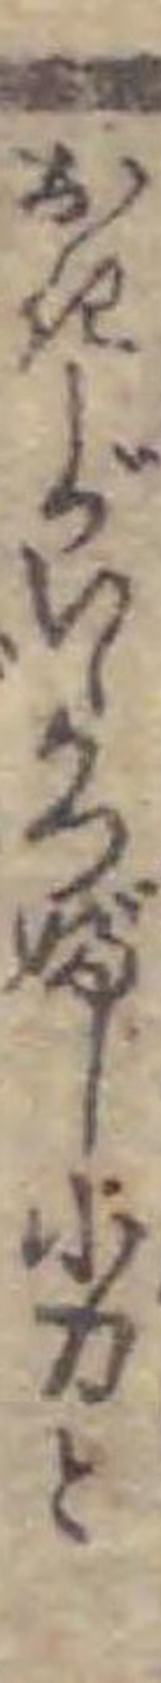おきしがいゝかつぶし小刀と
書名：年寄之冷水曽我 : 3巻
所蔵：国立国会図書館 National Diet Library, JAPAN
